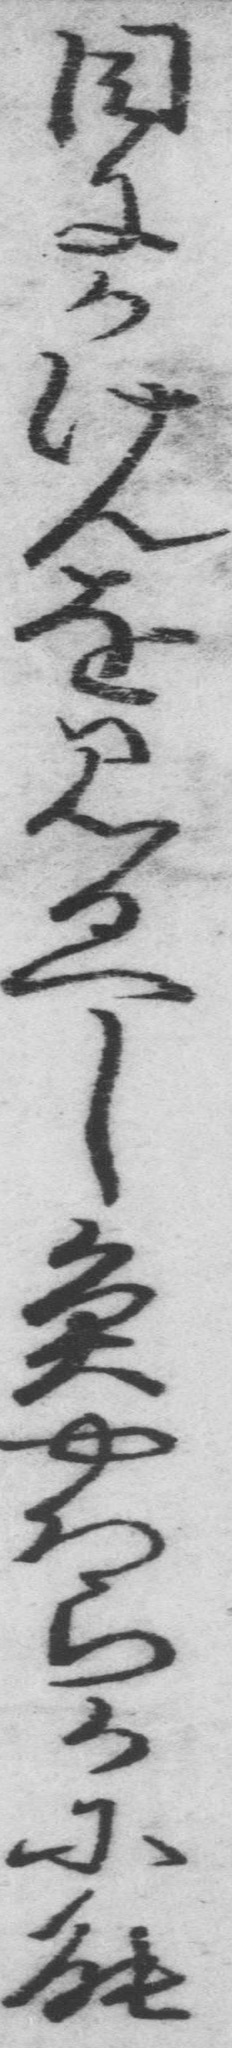目にかけんを見るへし魚やはらかに能
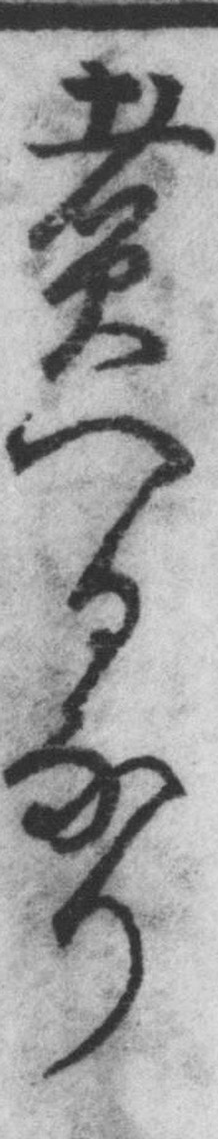煮へるなり
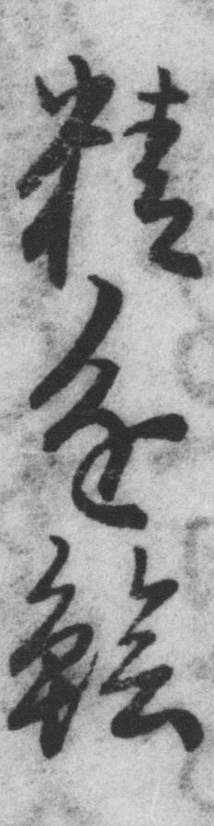精進鱠

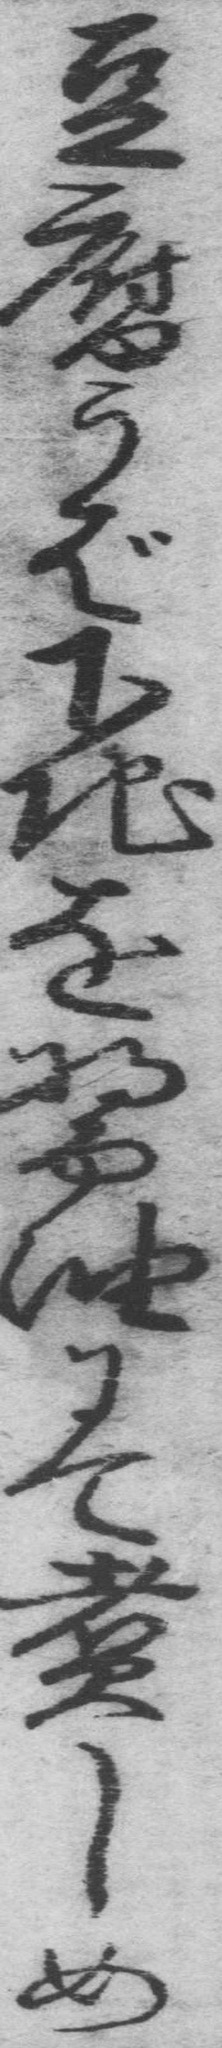豆腐うば下地を醤油にて煮しめ
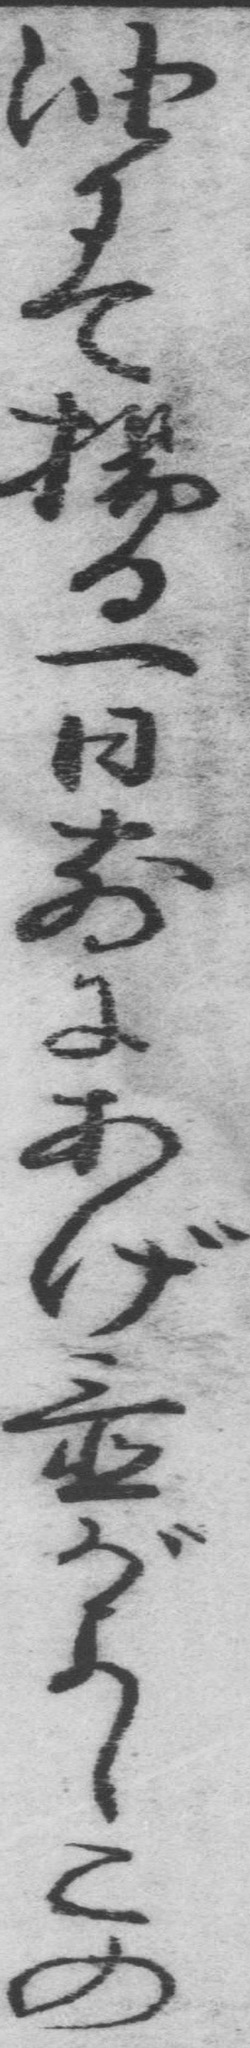油にて揚る一日前にあげ置がよしこの
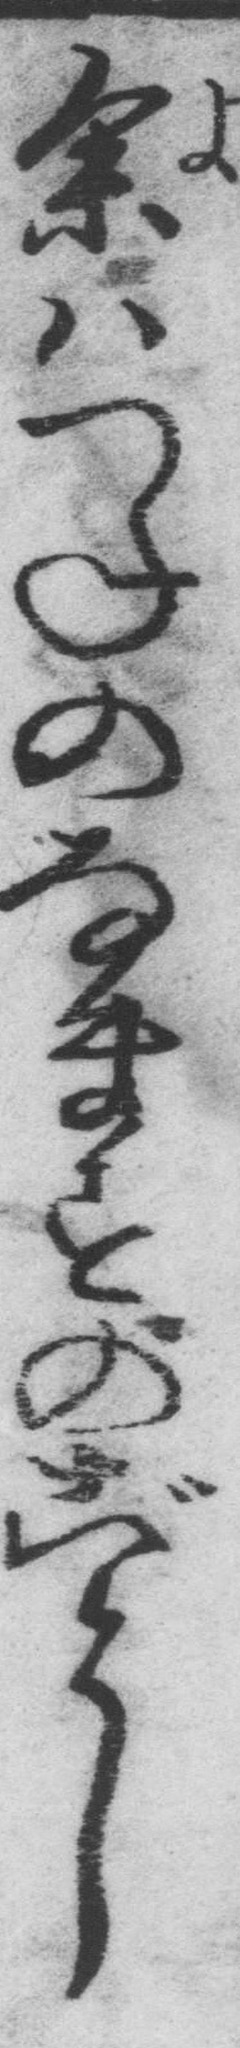余はつねのなますのごとし
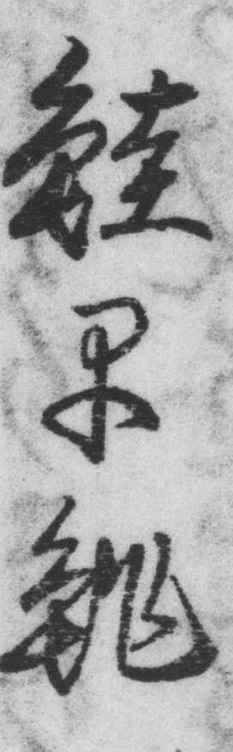鮭早鮓
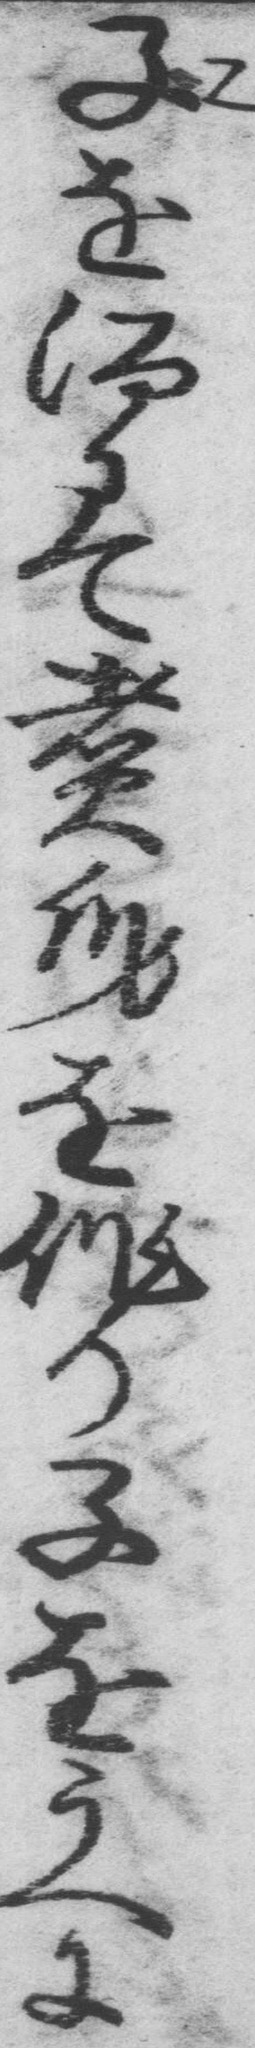子を酒にて煮身を作り子をうへに
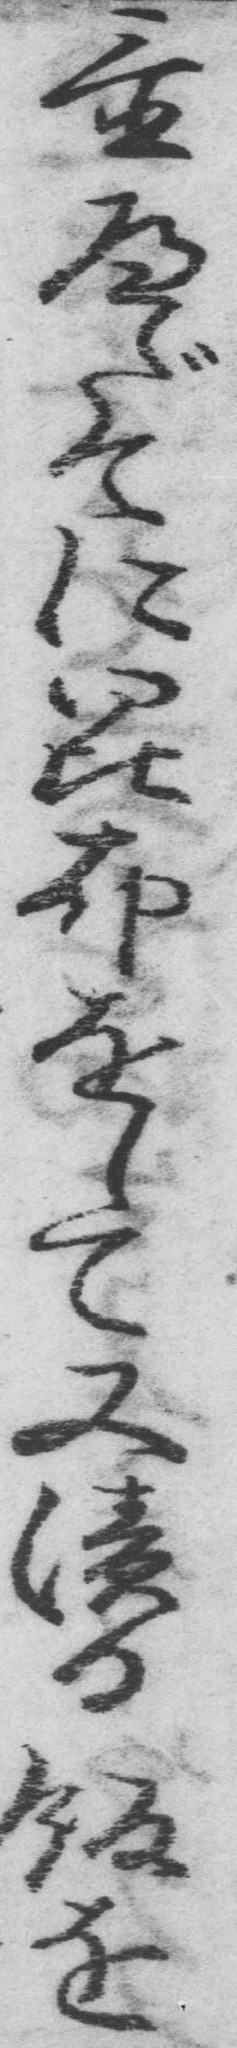置へだてに昆布をして又漬る飯を
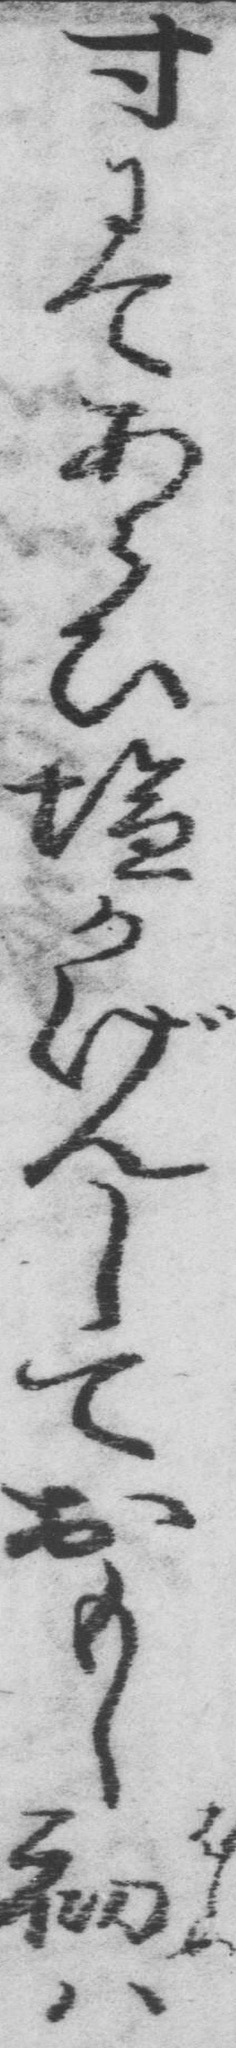すにてあらひ塩かげんしておもし初は
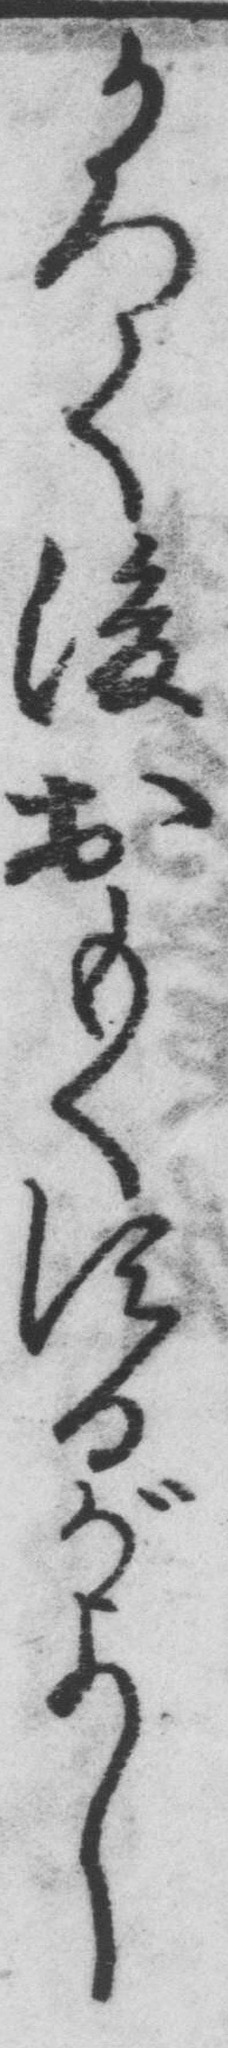かろく後おもくするがよし
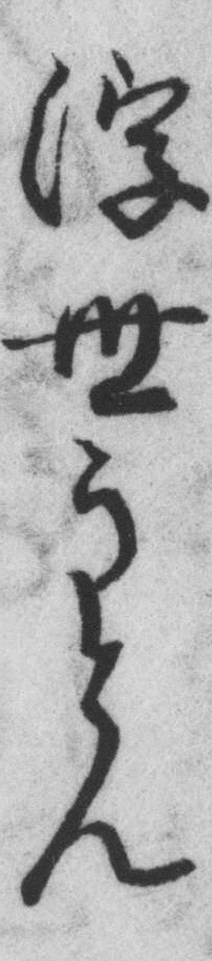浮世うとん
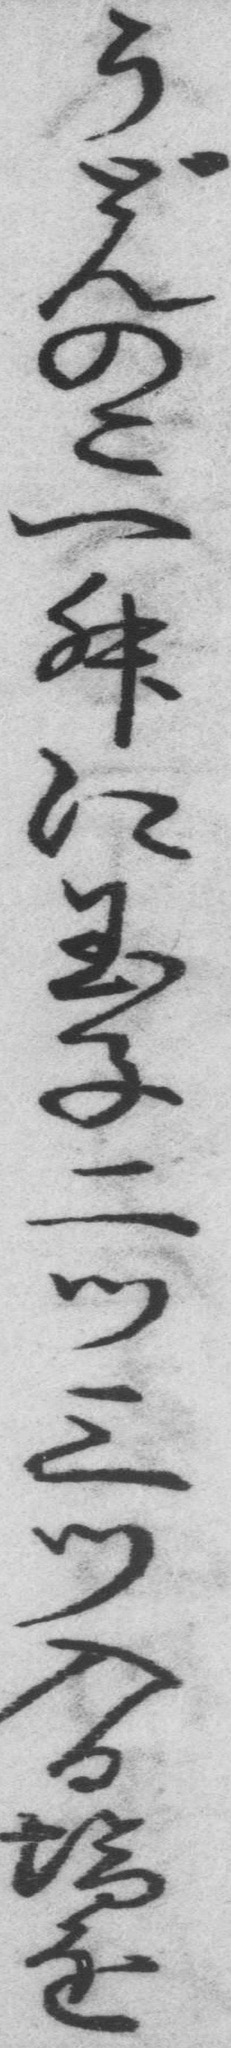うどんのこ一升に玉子二ツ三ツ入る塩を
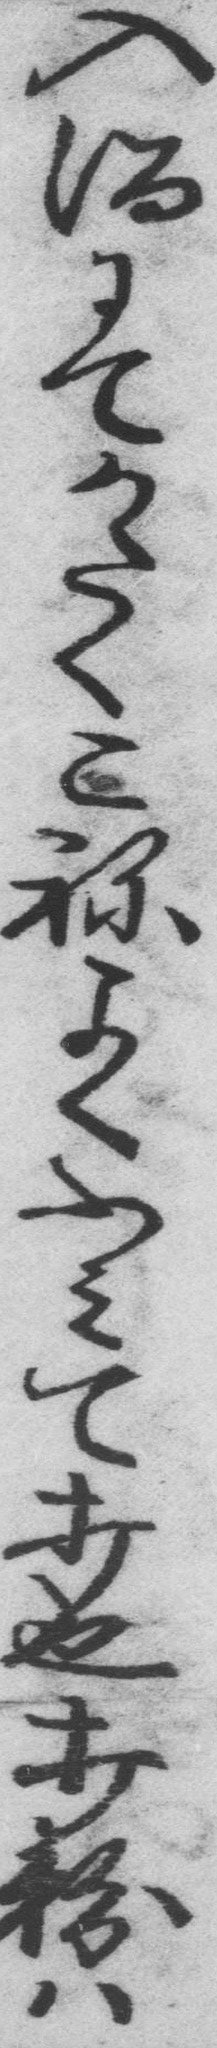入酒にてかたくこねよくふみて打也打粉は
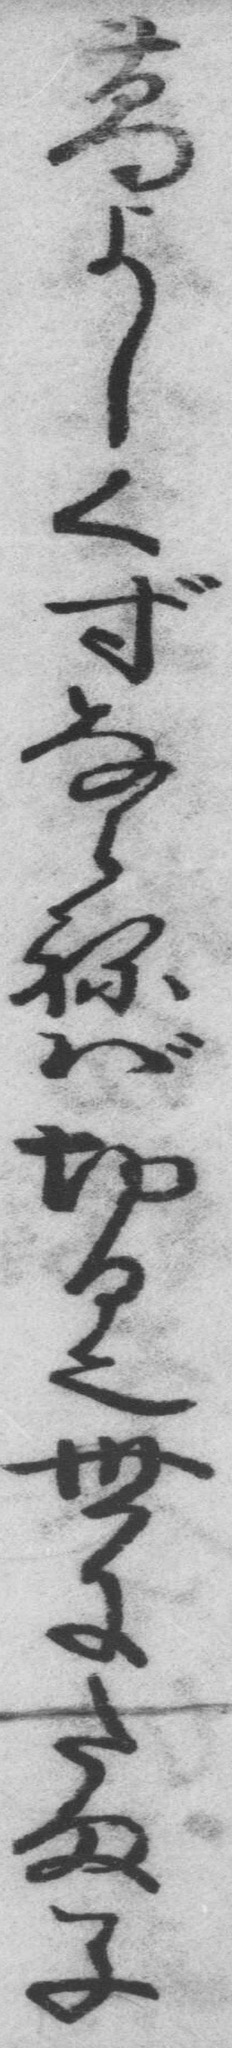葛よしくずならねば切る也世にたま子
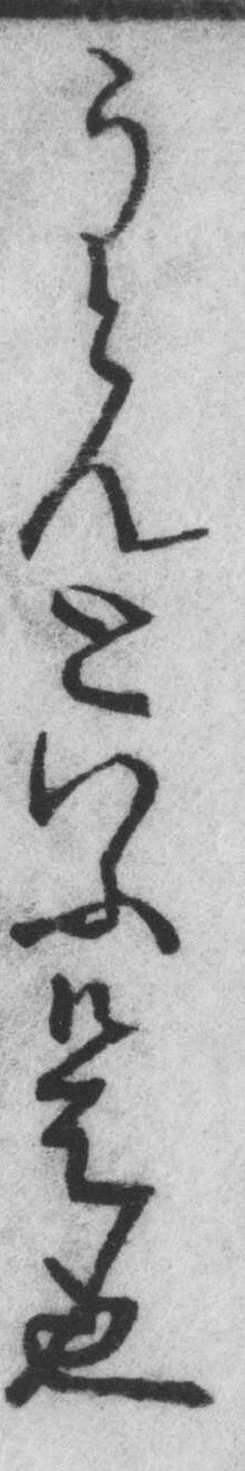うとんといふ是也
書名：料理山海郷
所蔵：大阪府立大学学術情報センター 国文学研究資料館
